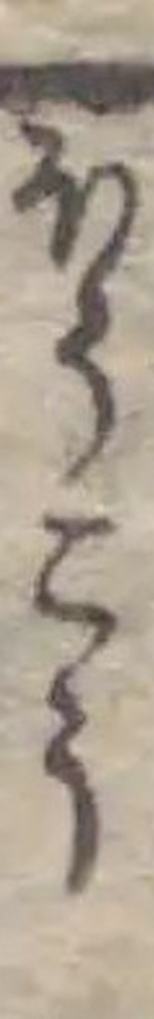ほうこう
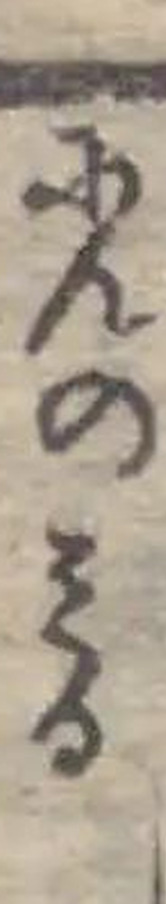にんのみる
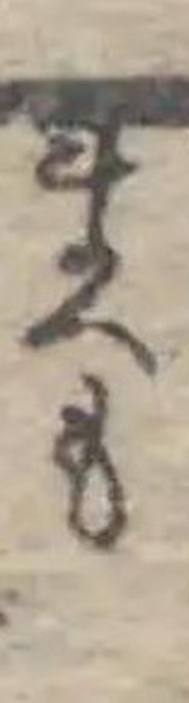まへも
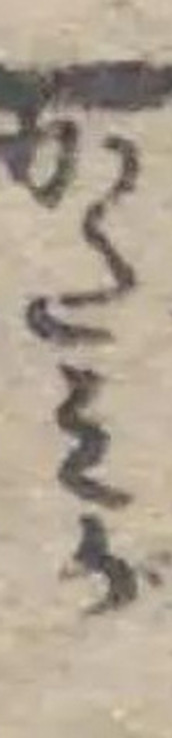かたみが
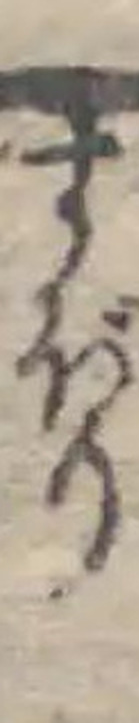すぼり
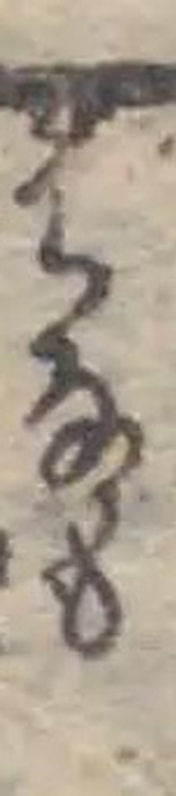はなも
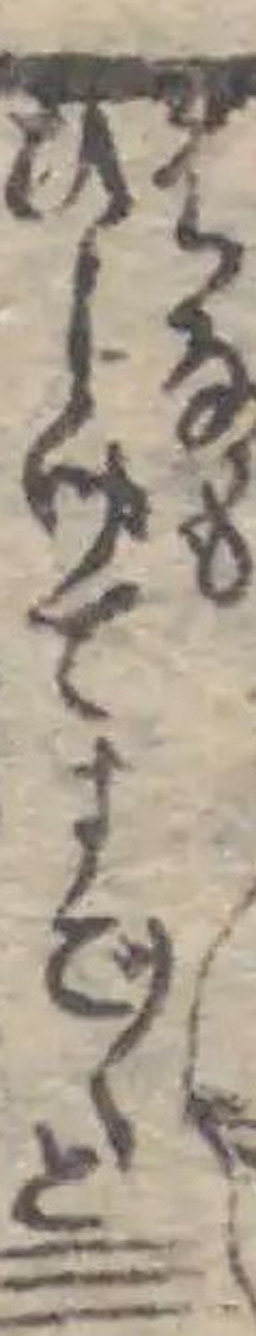ひしげてすご〳〵と
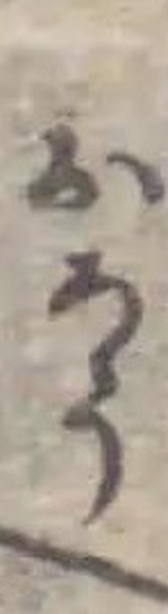おろう
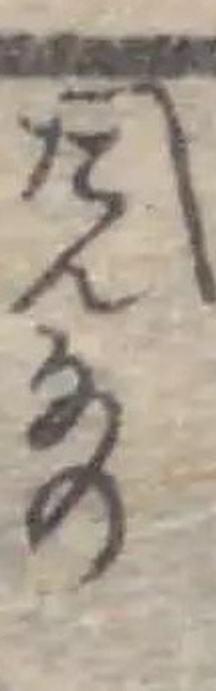〽たんなの
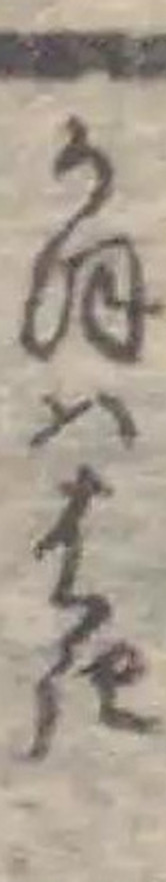かほはまき
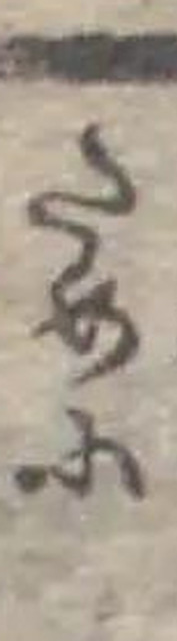ために
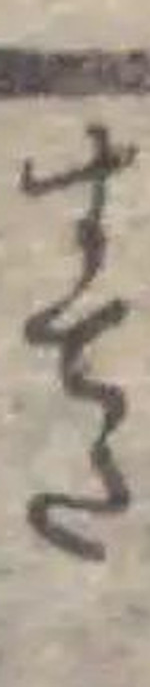すてた
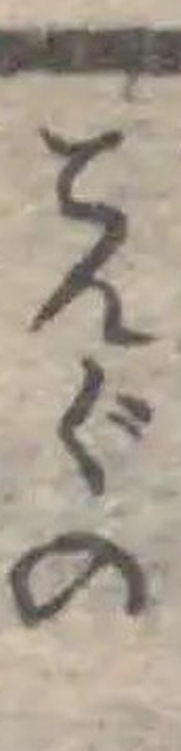てんぐの
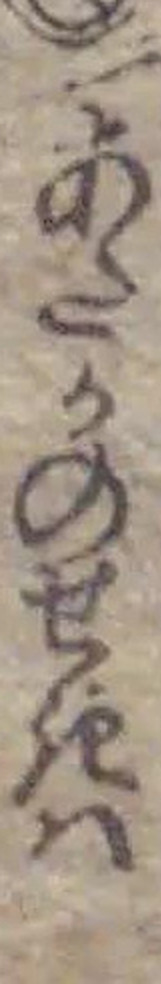〽あたかのせきは
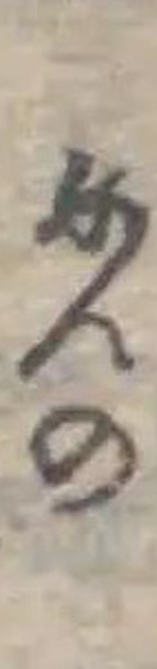めんの
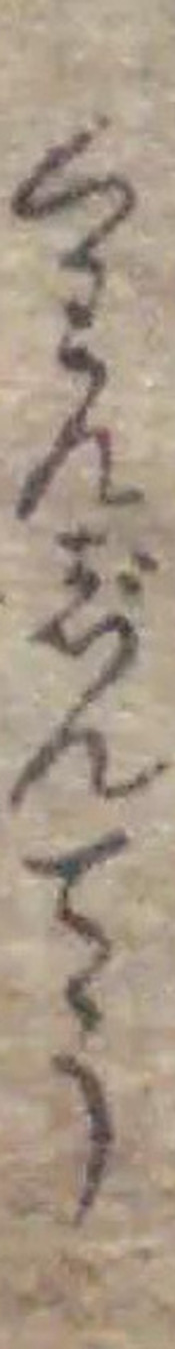くわんじんてう
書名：福壽海旡量品玉 3巻
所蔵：国立国会図書館 National Diet Library, JAPAN
